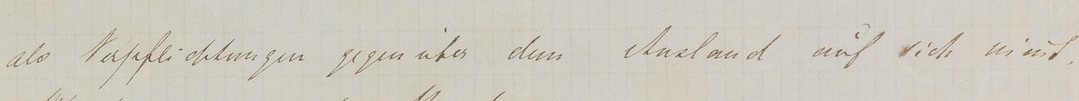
als Verpflichtungen gegenüber dem Ausland auf sich nimmt.
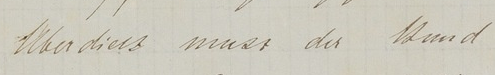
Überdiess muss der Bund
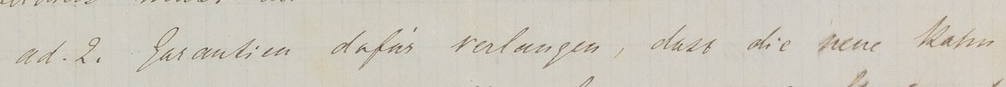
ad. 2. Garantien dafür verlangen, dass die neue Bahn
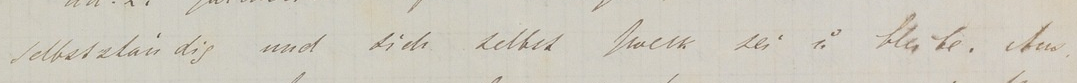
selbstständig und sich selbst Zweck sei u bleibe. Aus-
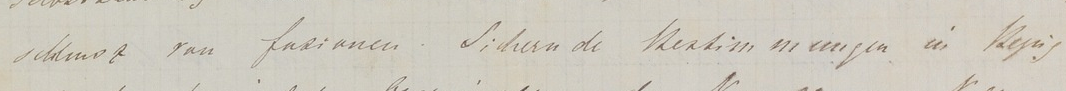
schluss von Fusionen. Sichernde Bestimmungen in Bezug
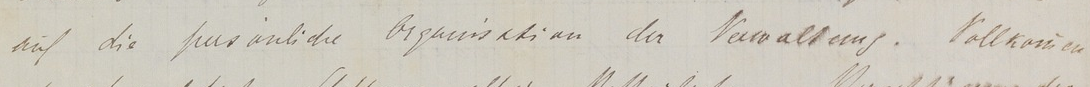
auf die persönliche Organisation der Verwaltung. Vollkommen
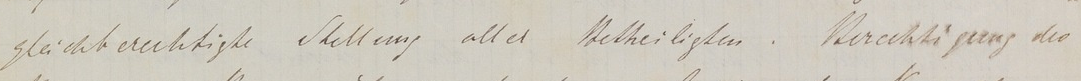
gleichberechtigte Stellung aller Betheiligten. Berechtigung des
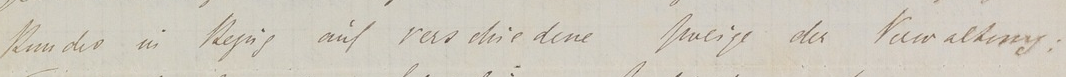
Bundes in Bezug auf verschiedene Zweige der Verwaltung:
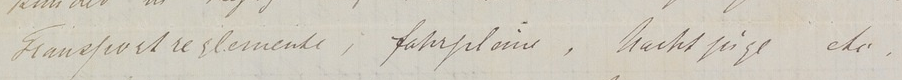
Transportreglemente, Fahrpläne, Nachtzüge etc.
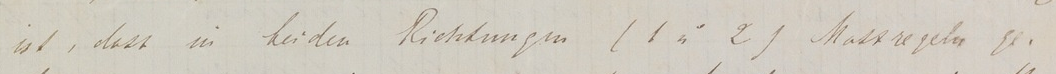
ist, dass in beiden Richtungen (1 u 2) Massregeln ge-
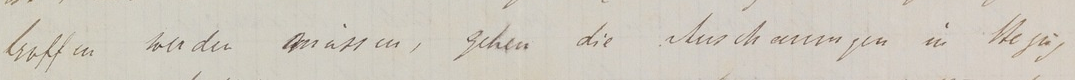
troffen werden müssen, gehen die Anschauungen in Bezug
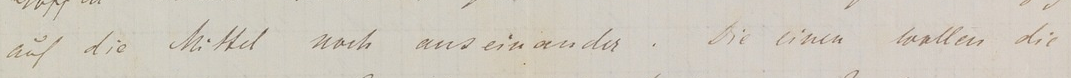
auf die Mittel noch auseinander. Die einen wollen die
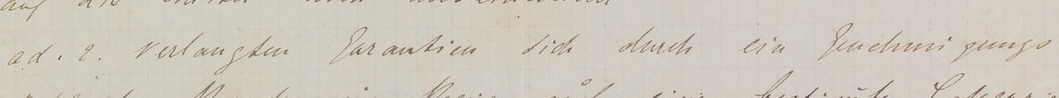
ad. 2. verlangten Garantien sich durch ein Genehmigungs-
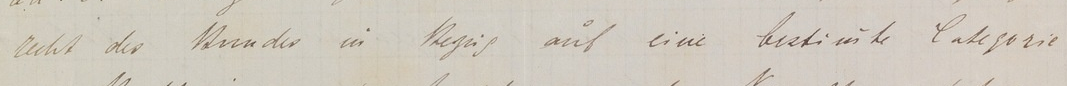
recht des Bundes in Bezug auf eine bestimmte Categorie
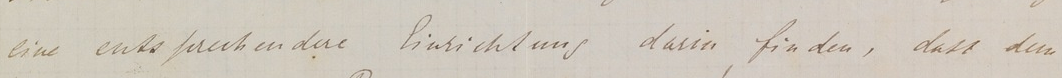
eine entsprechendere Einrichtung darin finden, dass dem
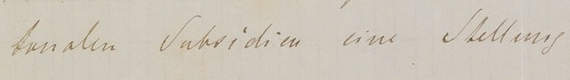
tonalen Subsidien eine Stellung in
